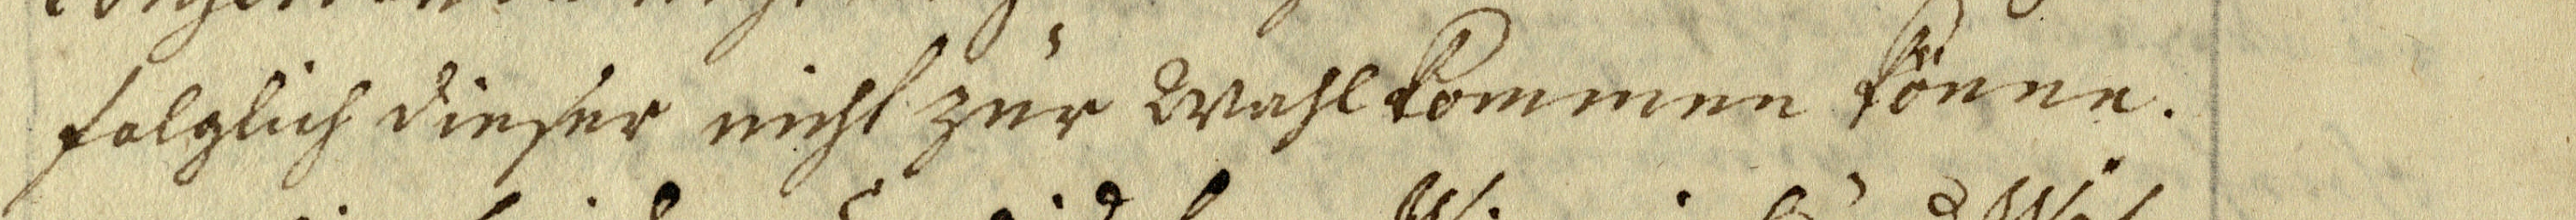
folglich dieser nicht zur Wahl komen könne.
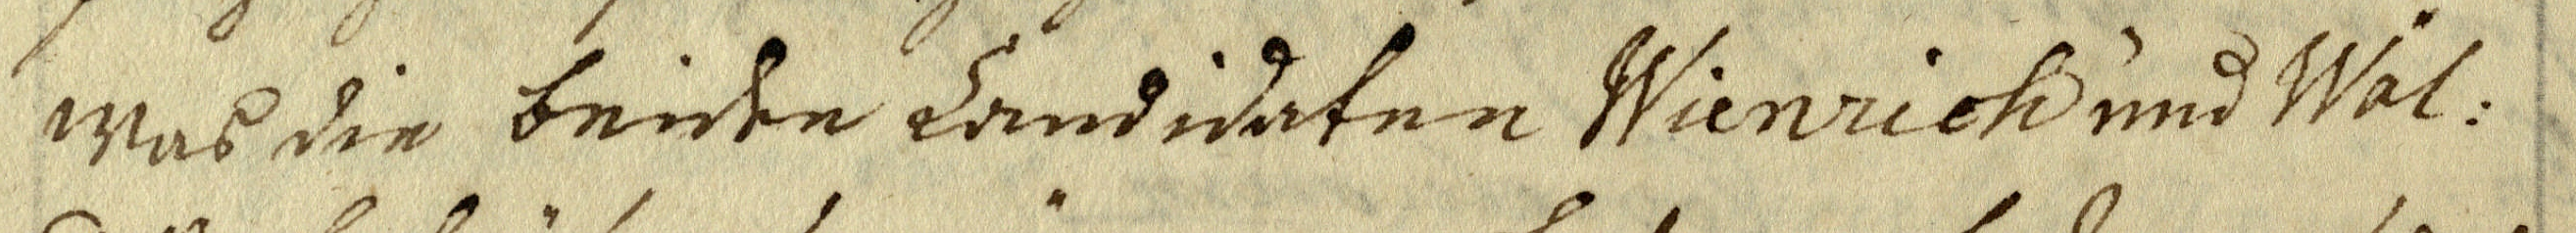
Was die beiden Candidaten Wienrich und Wöl¬
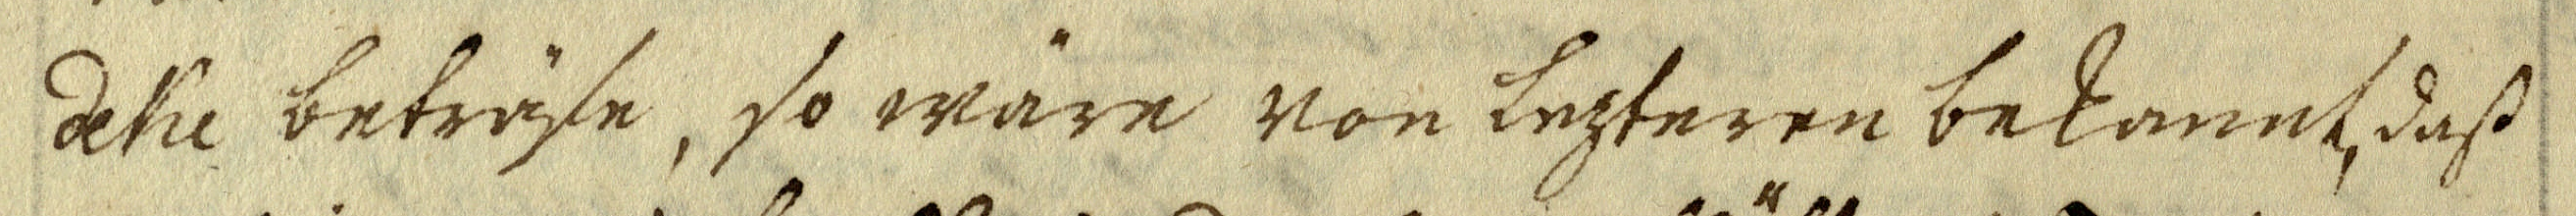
deke beträfe, so wäre von lezteren bekannt, daß
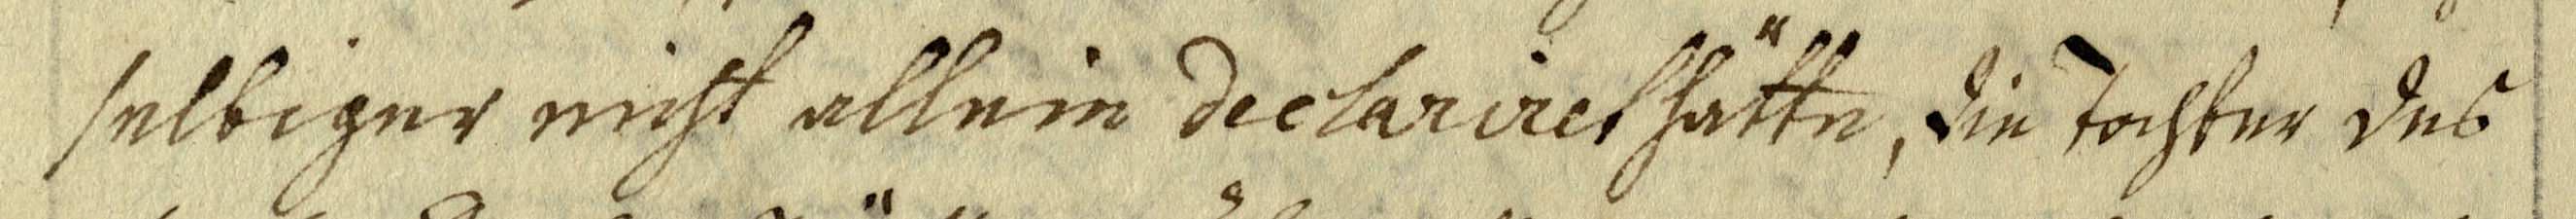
selbiger nicht allein declariret hätte, die Tochter des
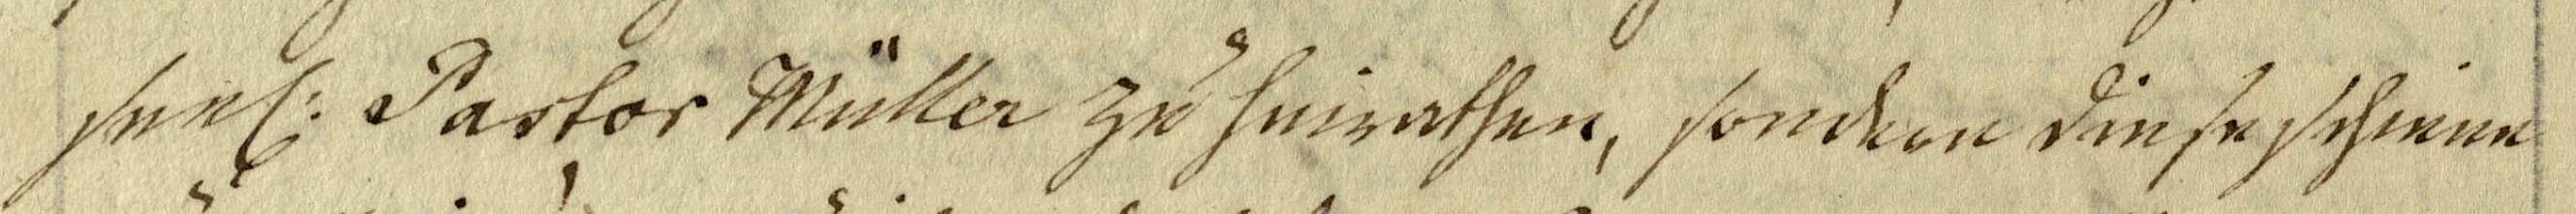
seel: Pastor Müller zu heirathen, sondern diese scheine
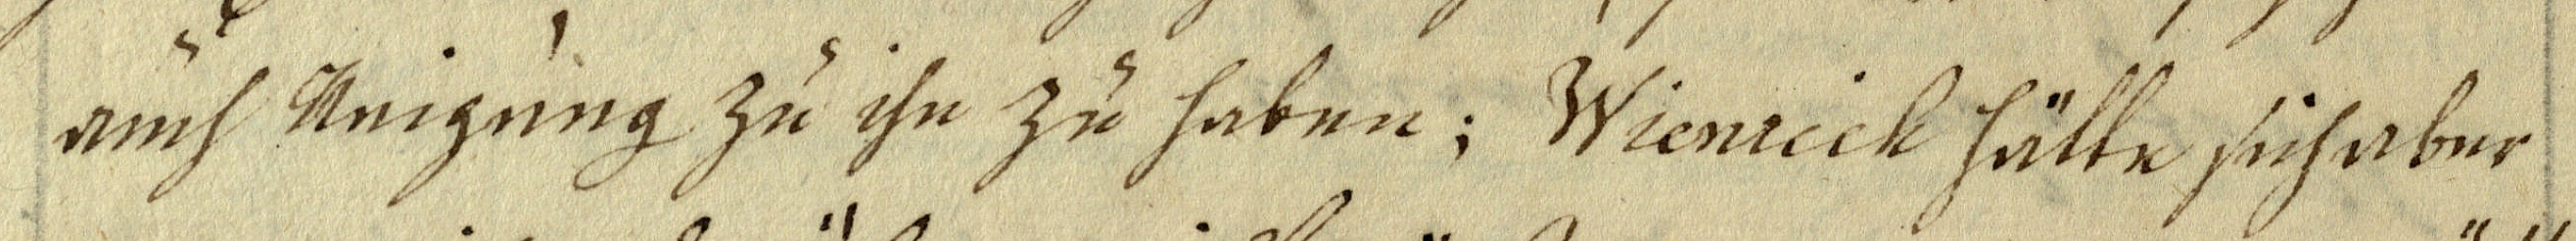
auch Neigung zu ihn zu haben; Wienrich hätte sich aber
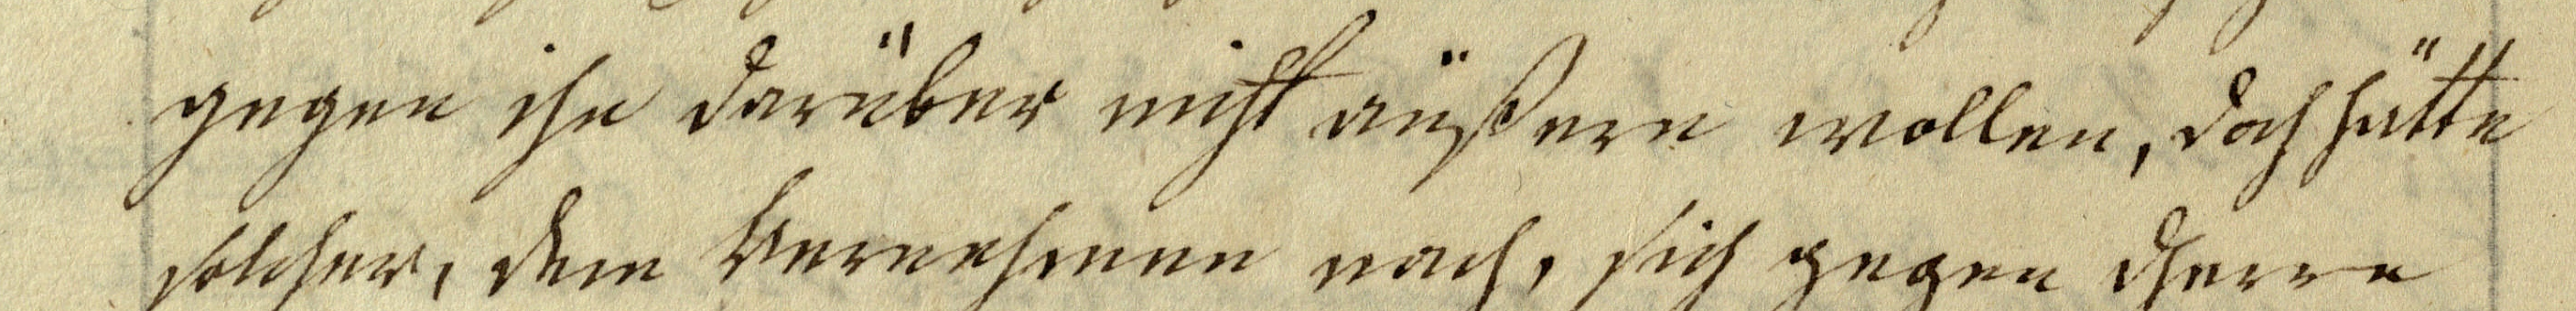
gegen ihn darüber nichtäußern wollen, doch hätte
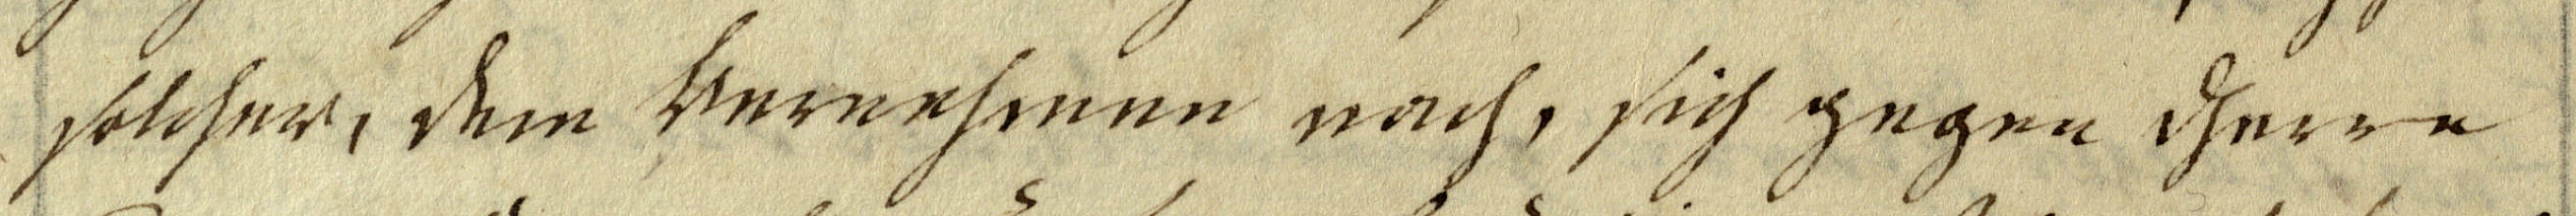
solcher, dem Vernehmen nach, sich gegen dHerrn
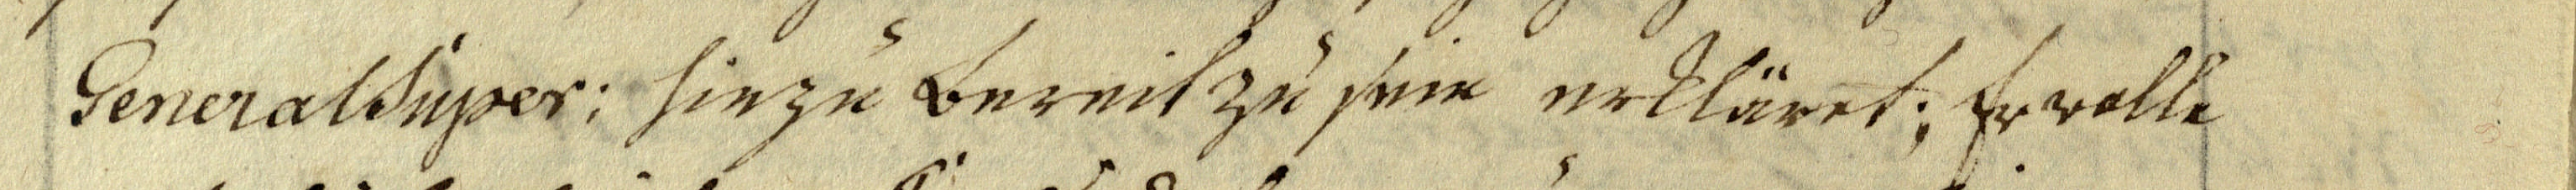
GeneralSuper: hiezu bereit zu sein erkläret: Er wolle
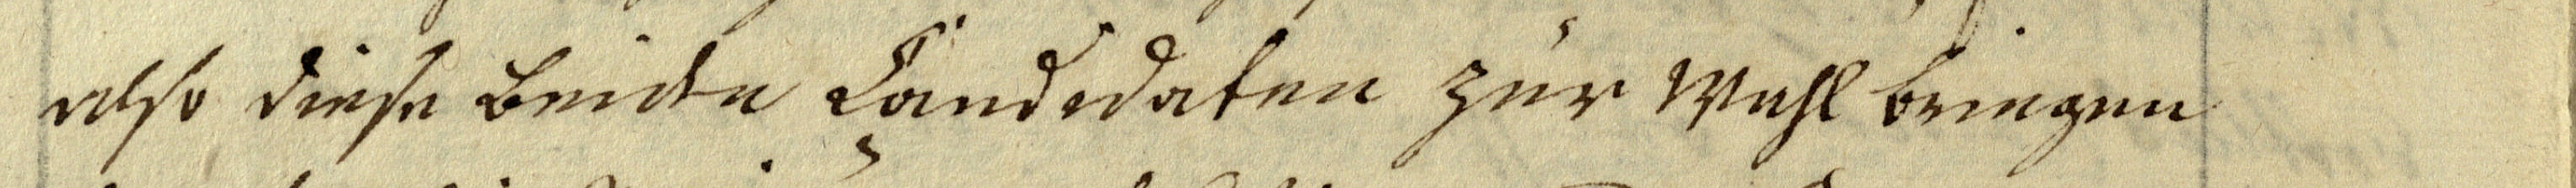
alsodiese beiden Candidaten zur Wahl bringen
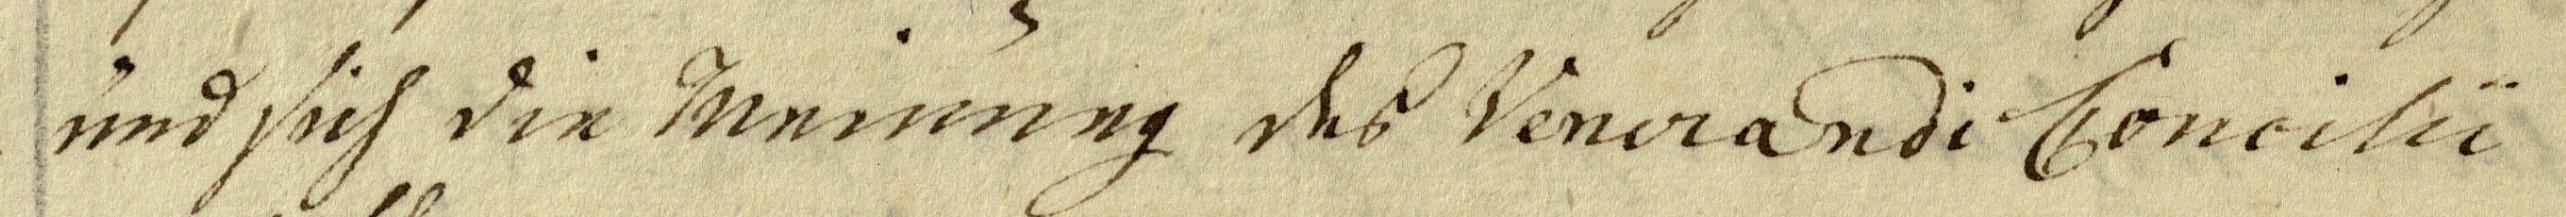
und sich die Meinung des Venerandi Concilii
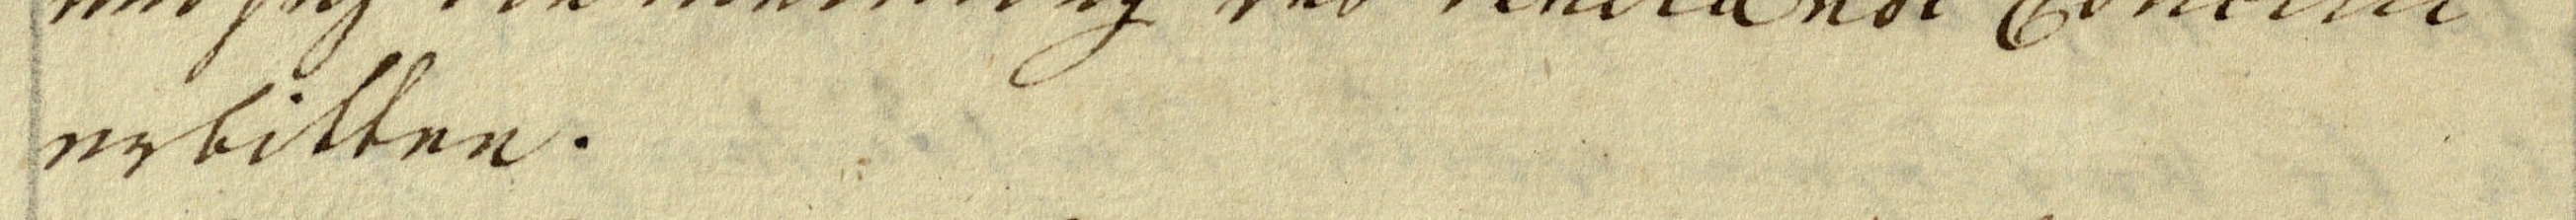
erbitten.
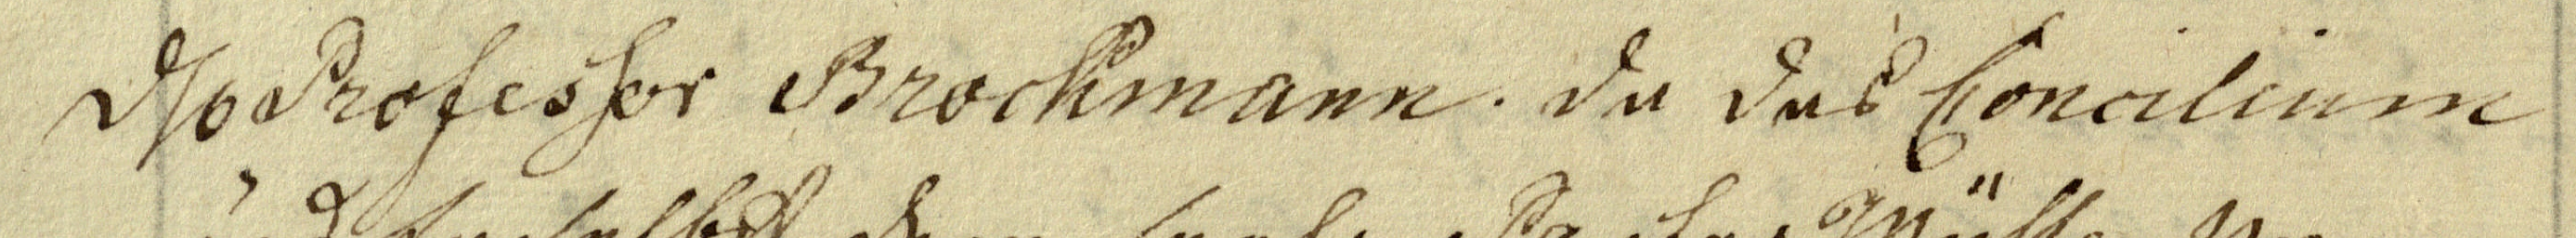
dh Professor Brockmann. da das Concilium
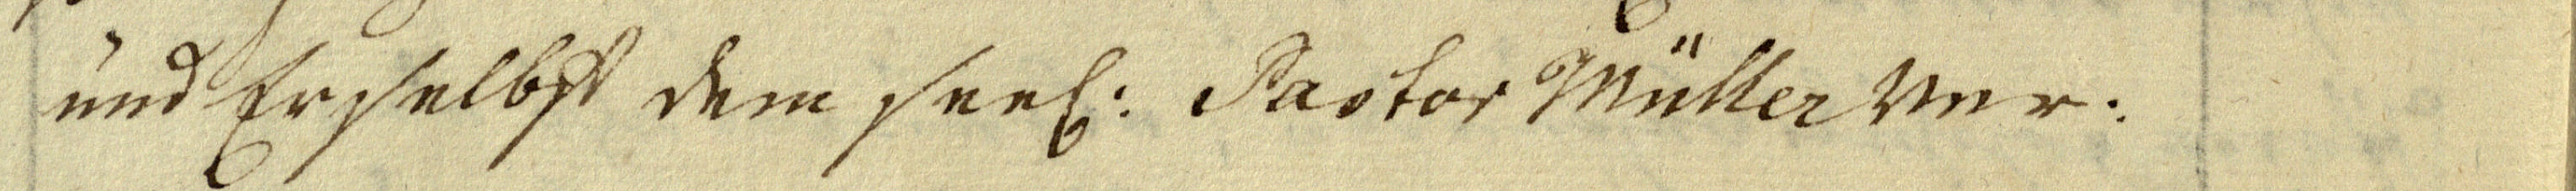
und Er selbst dem seel: Pastor Müller ver¬
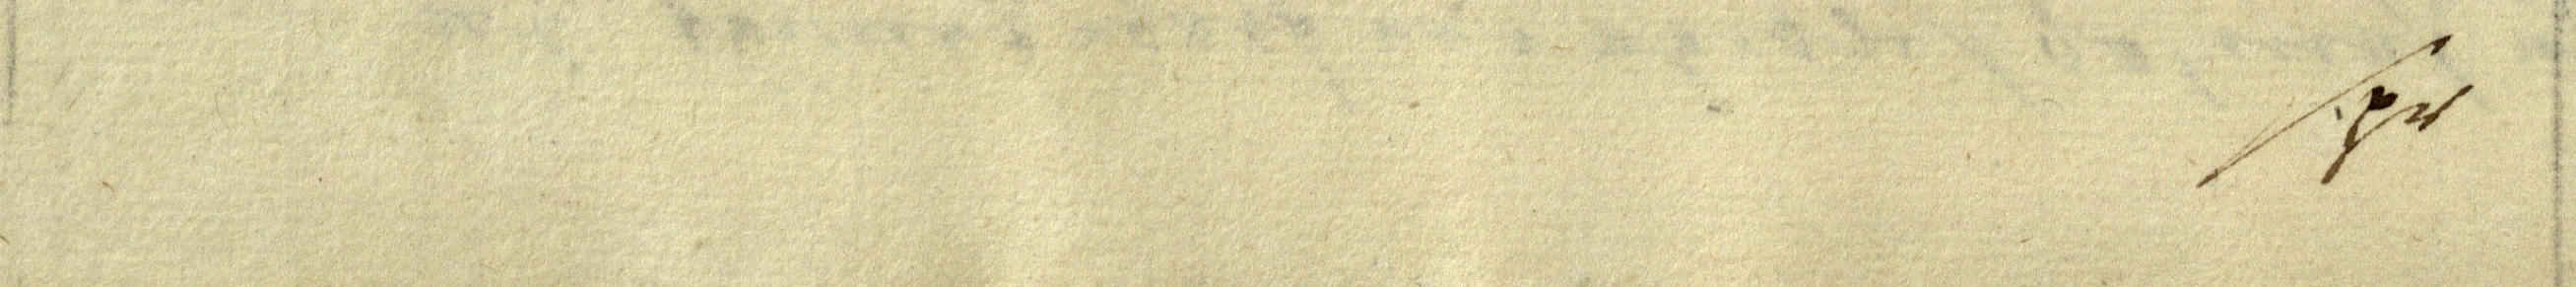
spr
